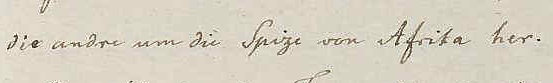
die andre um die Spize von Afrika her.
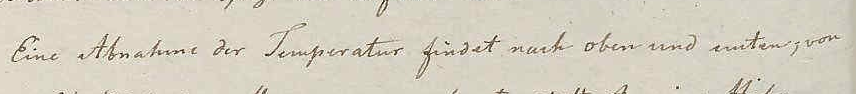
Eine Abnahme der Temperatur findet nach oben und unten; von
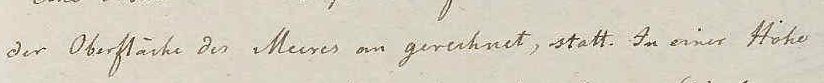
der Oberfläche des Meeres an gerechnet, statt. In einer Höhe
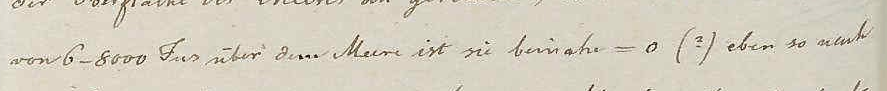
von 6–8000 Fus über dem Meere ist sie beinahe 0 eben so nach
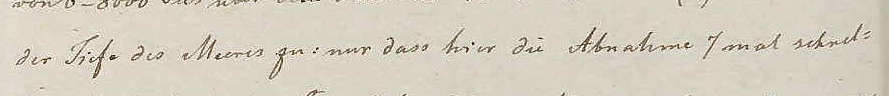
der Tiefe des Meeres zu: nur dass hier die Abnahme 7 mal schnel-
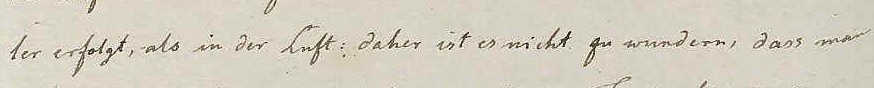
ler erfolgt, als in der Luft: daher ist es nicht zu wundern, dass man
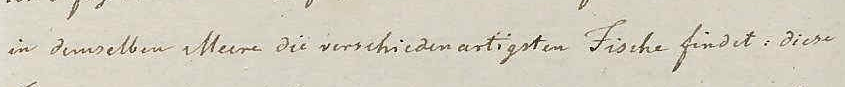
in demselben Meere die verschiedenartigsten Fische findet: diese
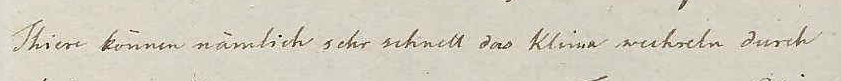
Thiere können nämlich sehr schnell das Klima wechseln durch
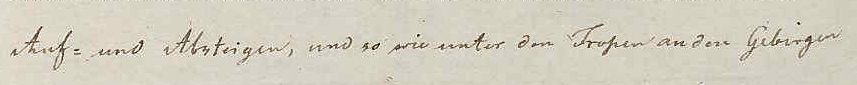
Auf- und Absteigen, und so wie unter den Tropen an den Gebirgen
